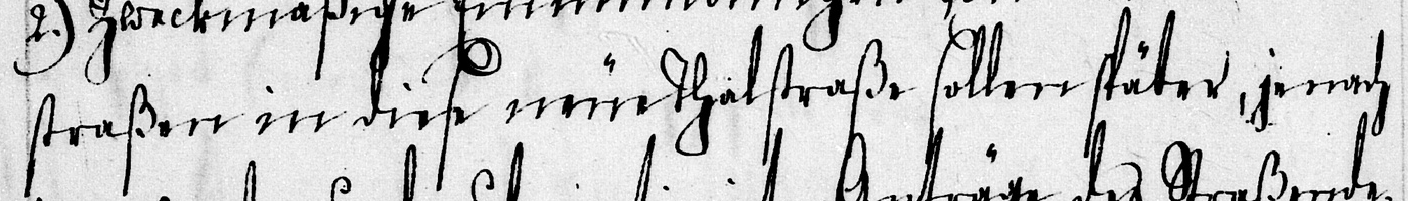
straßen in diese neue Thalstraße sollen später, je nach
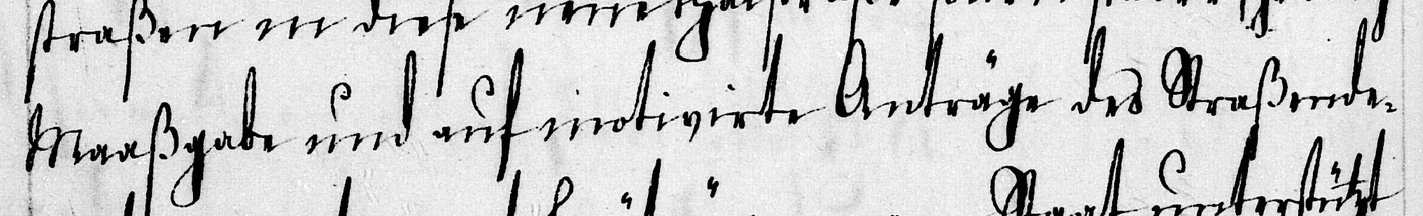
Maaßgabe und auf motivirte Anträge des Straßende¬
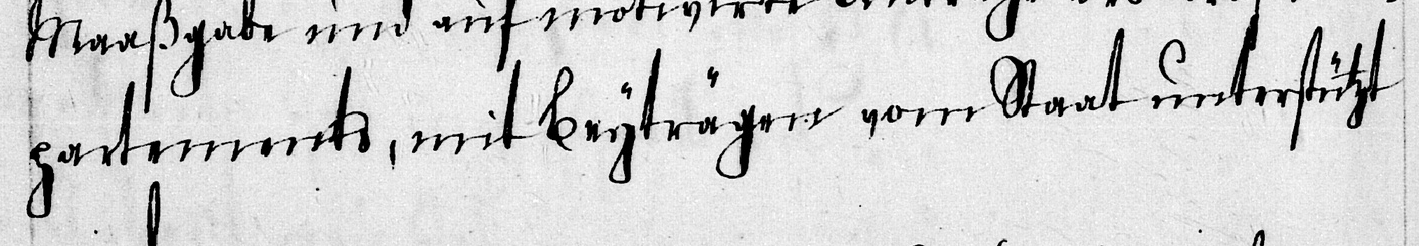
partements, mit Beyträgen vom Staat unterstützt
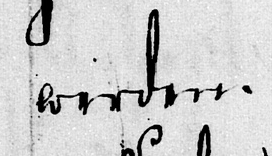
werden.
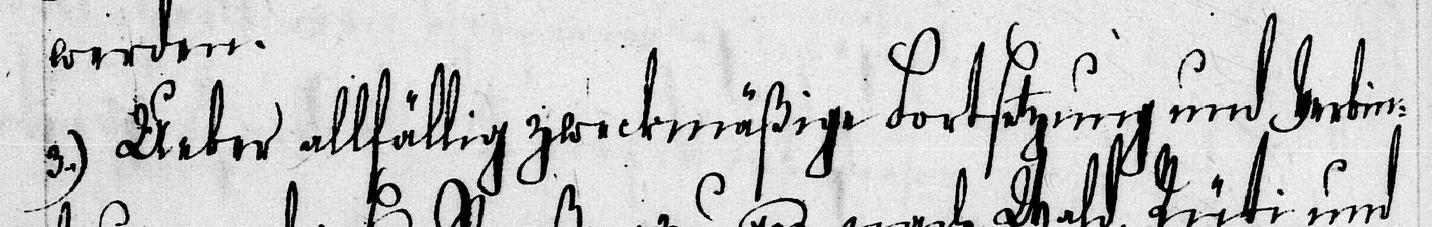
3.) Ueber allfällig zweckmäßige Fortsetzung und Verbi¬
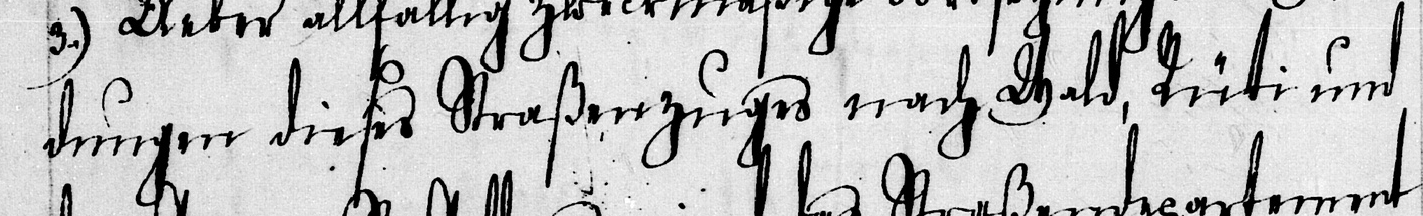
ndungen dieses Straßenzuges nach Wald, Rüti und
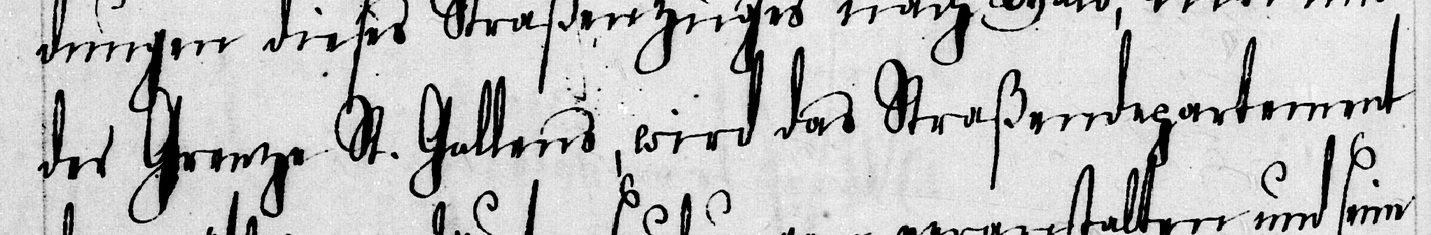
der Grenze St. Gallen, wird das Straßendepartement
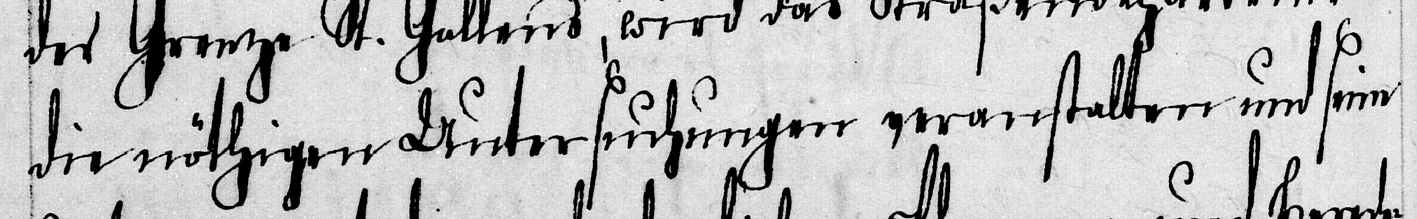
die nöthigen Untersuchungen veranstalten und seine
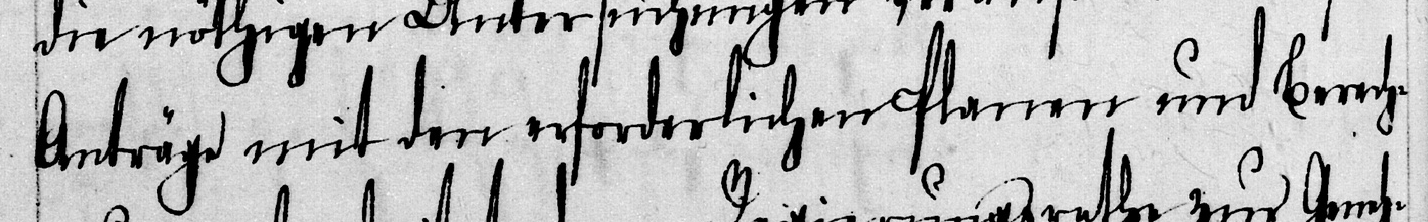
Anträge mit den erforderlichen Planen und Berech¬
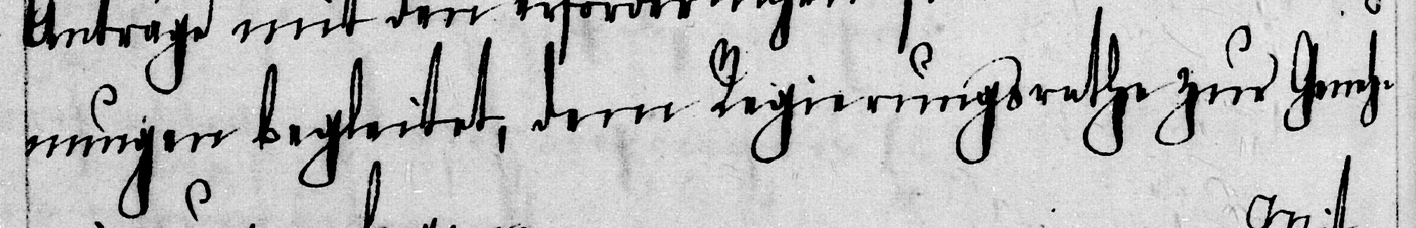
nungen begleitet, dem Regierungsrathe zur Geneh¬
